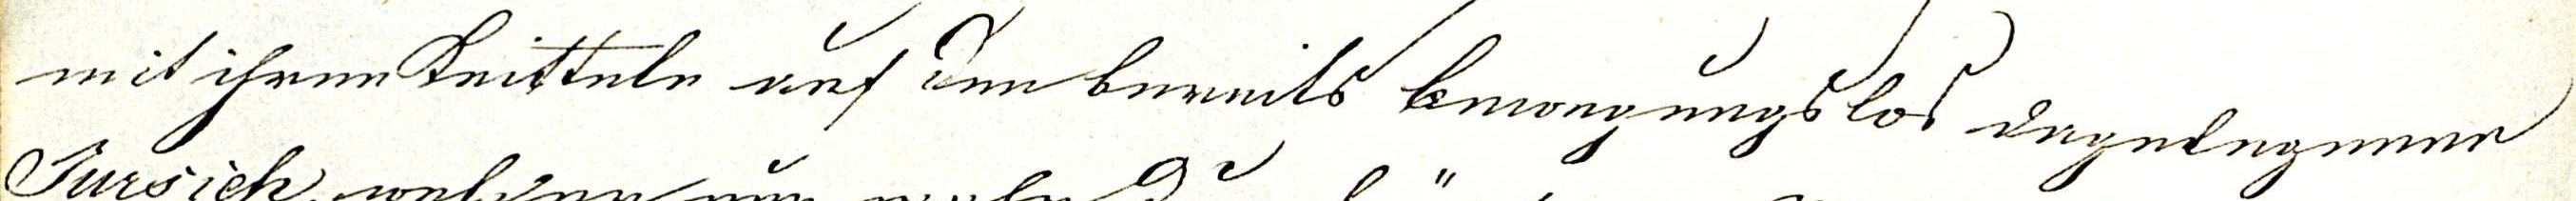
mit ihren Knitteln auf den bereits bewegungslos dagelegenen
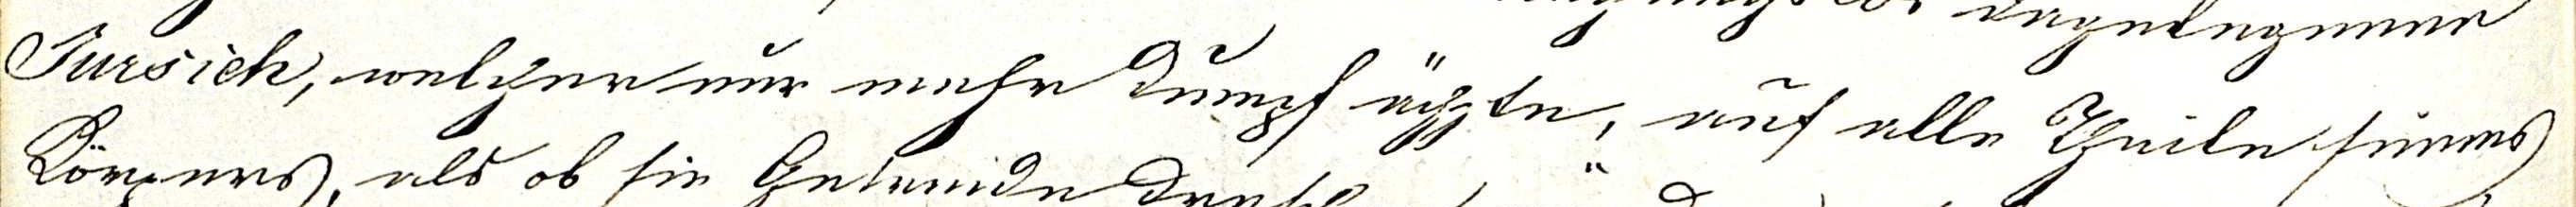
Jursich, welcher nur mehr dumpf ächzte, auf alle Theile seines
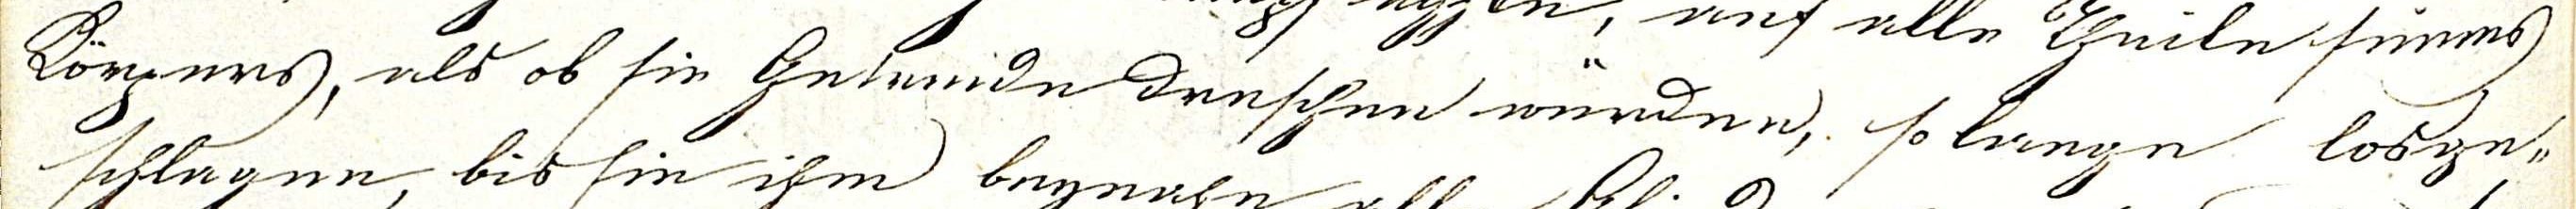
Körpers, als ob sie Getreide dreschen würden, so lange losge¬
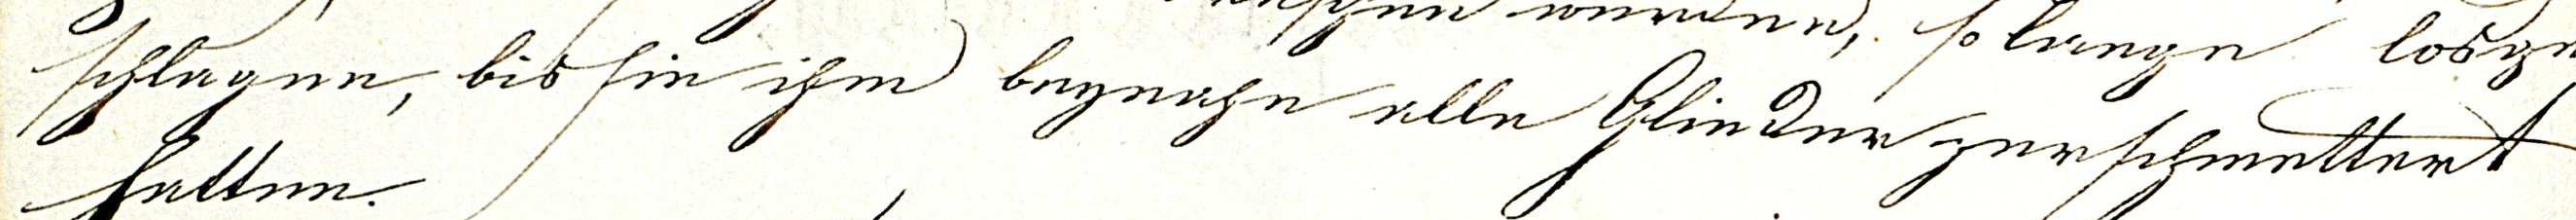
schlagen, bis sie ihm beynahe alle Glieder zur schmettert
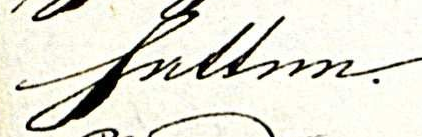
hatten.
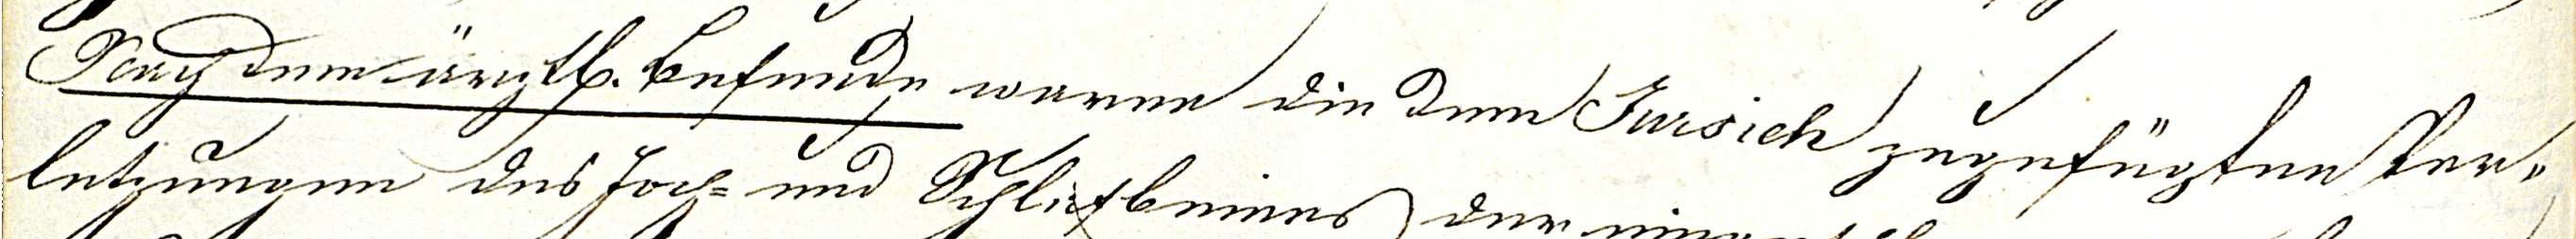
Nach dem ärztl. Befunde waren die dem Jursich zugefügten Ver¬
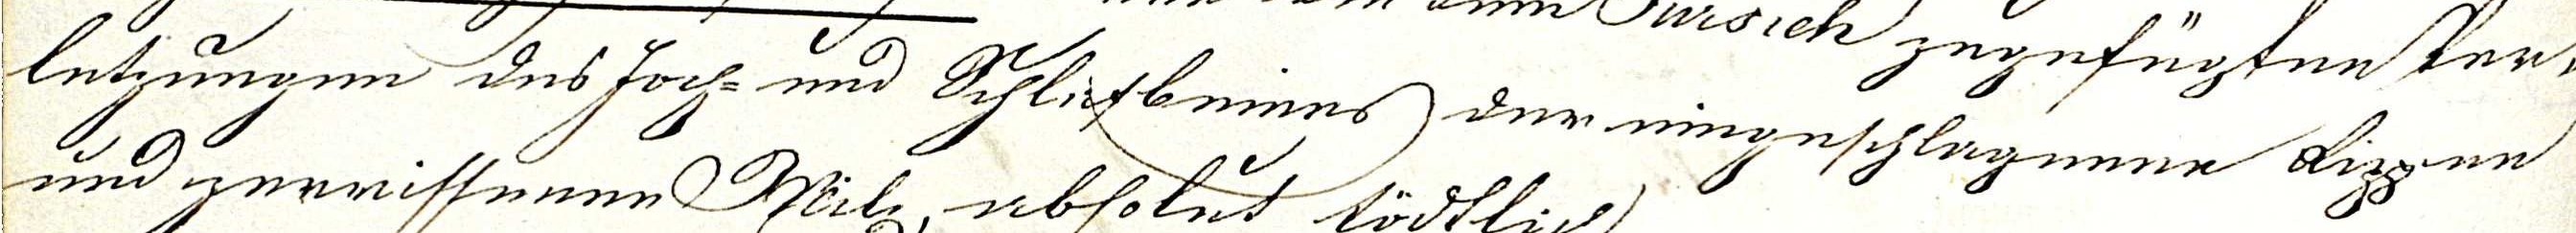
letzungen des Joch- und Schlafbeines der eingeschlagenen Rippen
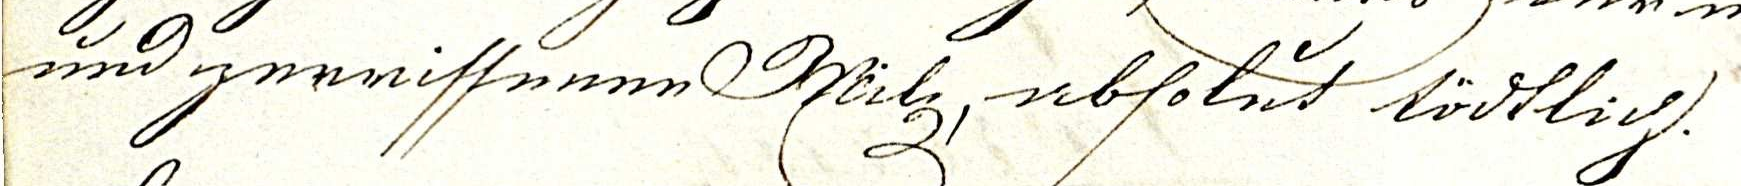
und zerrissenen Milz, absolut tödlich.
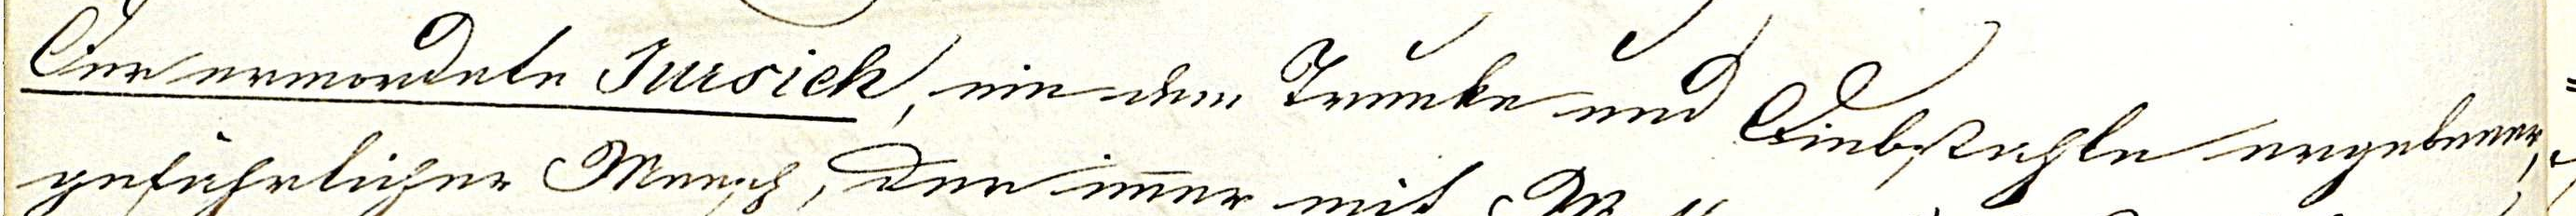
Der ermordete Jursich, ein dem Trunk und Diebstahle ergebenen
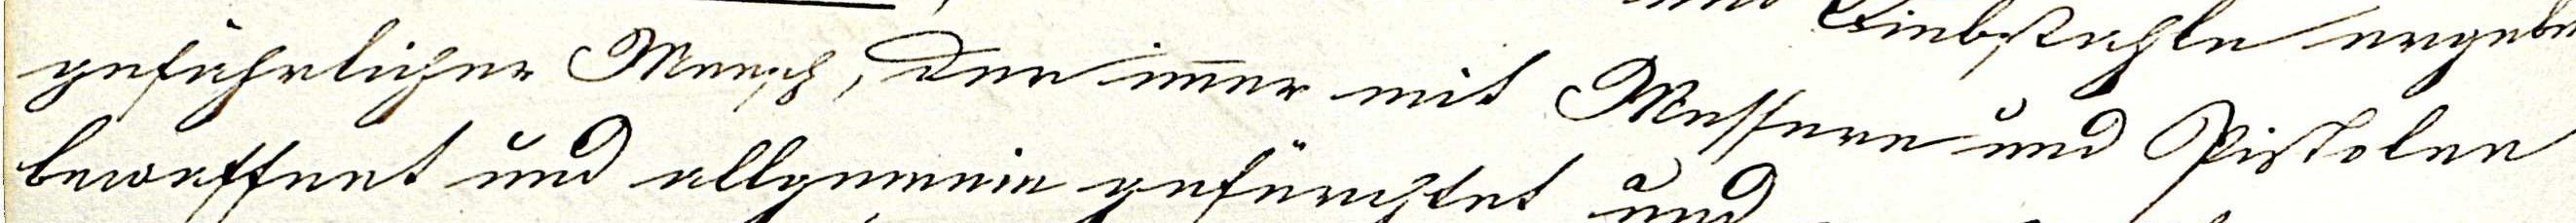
gefährlicher Mensch, der immer mit Messern und Pistolen
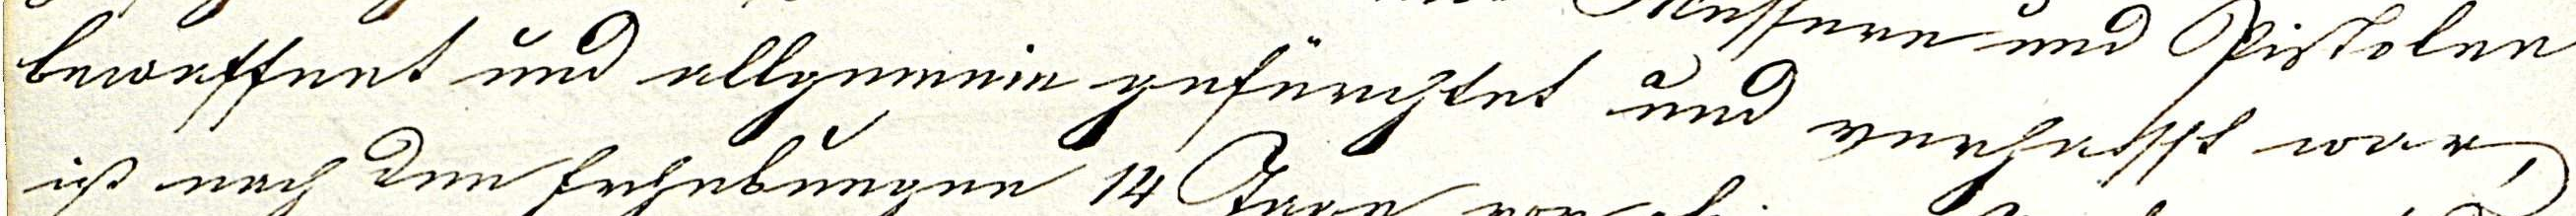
bewaffnet und allgemein gefürchtet und verhasst war,
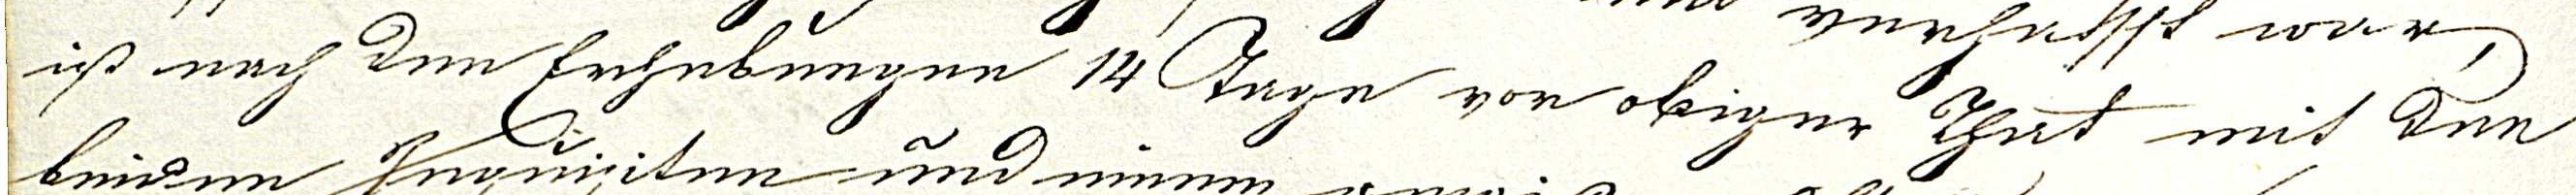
ist nach dem Erhebungen 14 Tage vor obiger That mit den
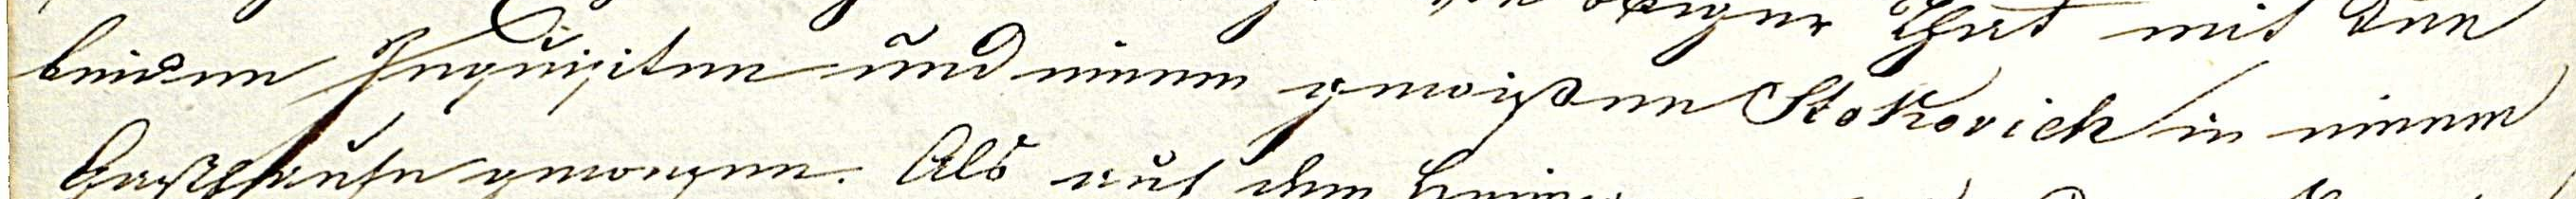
beiden Inquisiten und einem gewißen Stokovich in einem
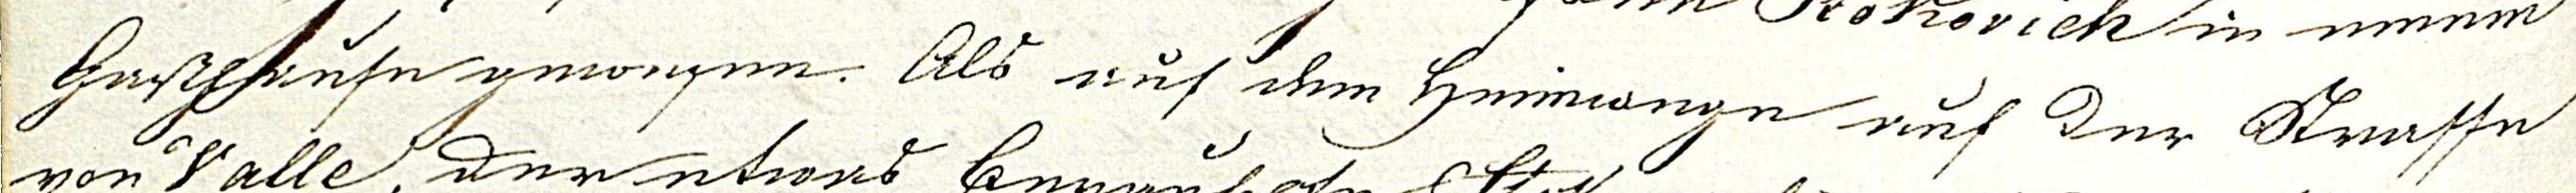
Gasthause gewesen. Als auf dem Heimwege auf der Strasse
